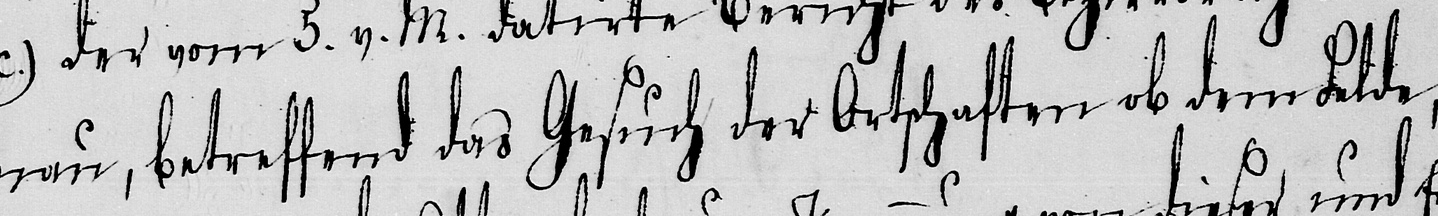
nau, betreffend das Gesuch der Ortschaften ob dem Felde,
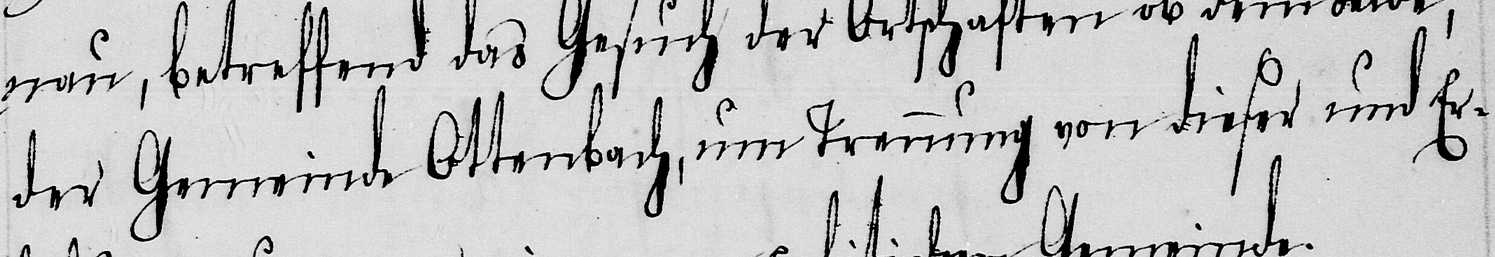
der Gemeinde Ottenbach, um Trennung von dieser und Er¬
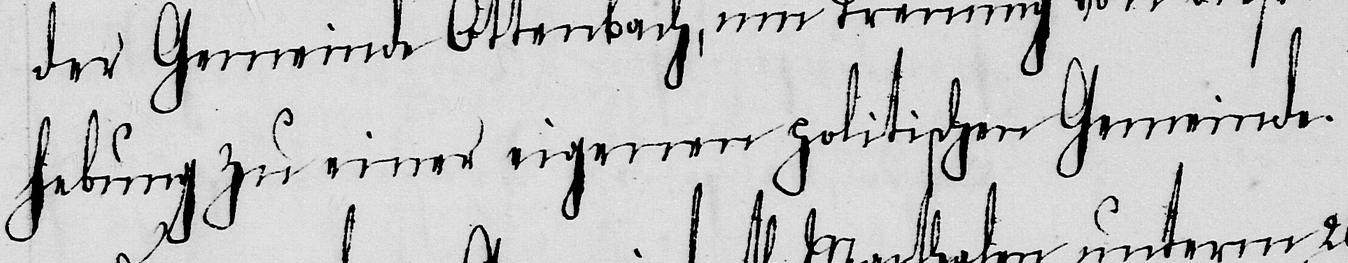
hebung zu einer eigenen politischen Gemeinde.
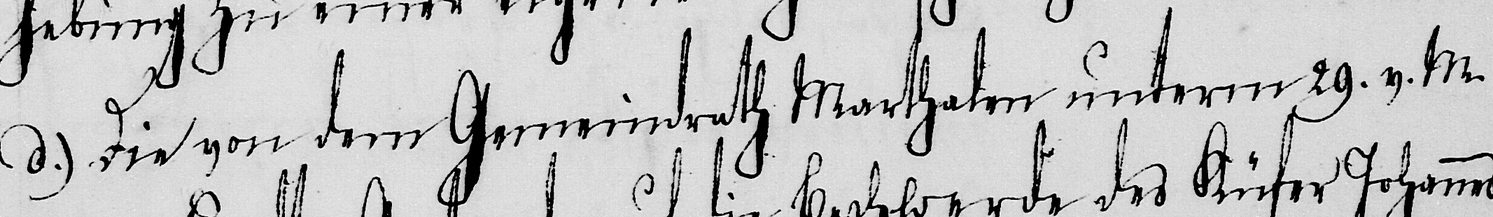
d.) Die von dem Gemeindrath Marthalen unterm 29. v. M.
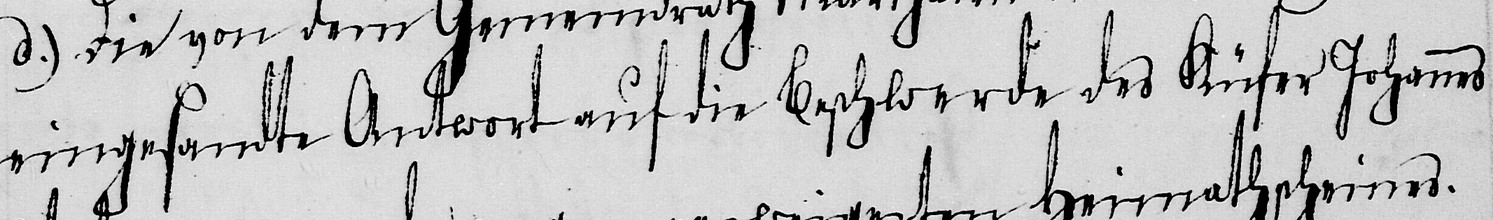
eingesandte Antwort auf die Beschwerde des Küfer Johannes
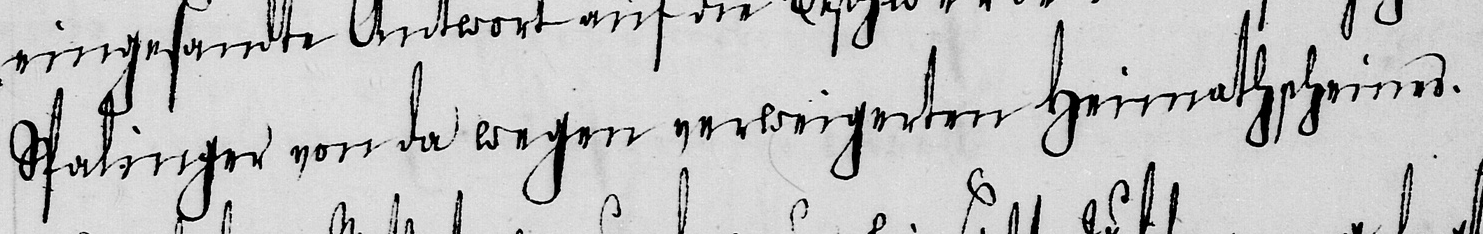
Spalinger von da wegen verweigerten Heimathscheines.
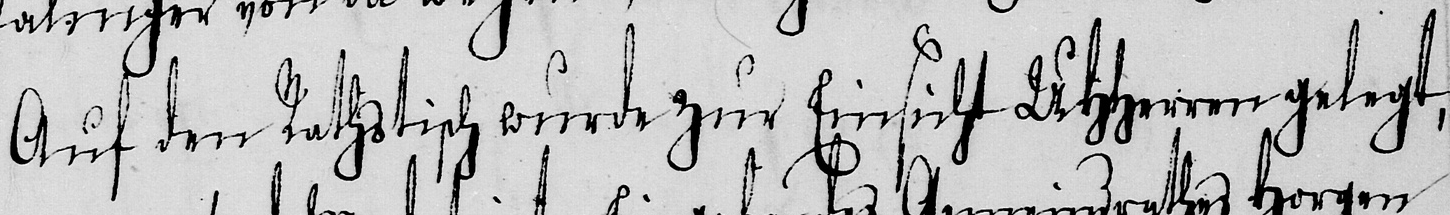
Auf den Rathstisch wurde zur Einsicht UHHerren gelegt,
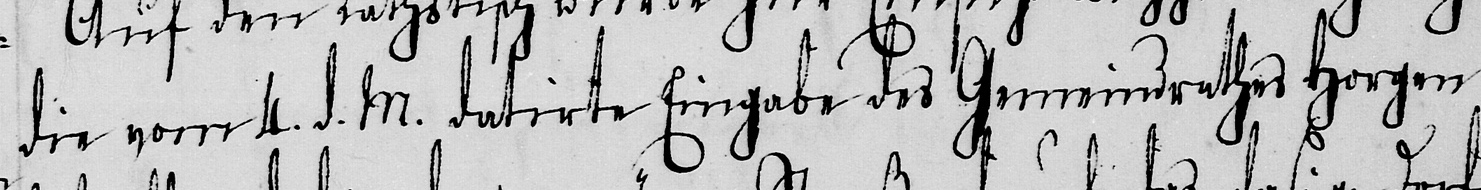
die vom 4. d. M. datirte Eingabe des Gemeindrathes Horgen
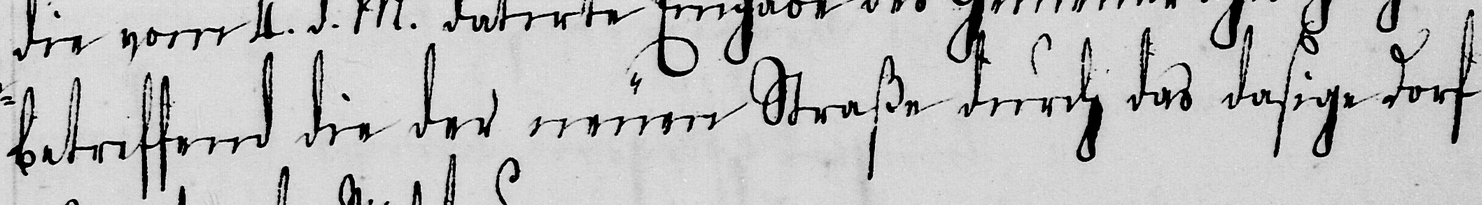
betreffend die der neuen Straße durch das dasige Dorf
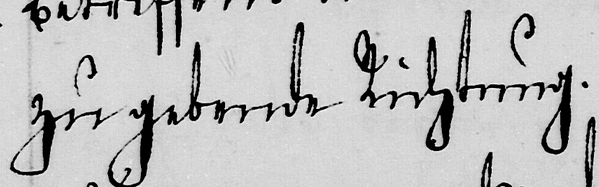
zu gebende Richtung.
